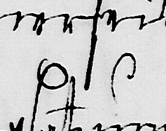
a 1.)
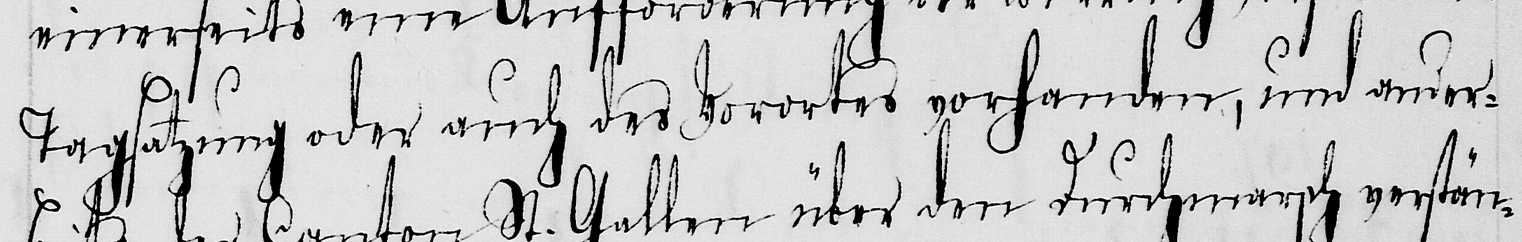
Tagsatzung oder auch des Vorortes vorhanden, und ander¬
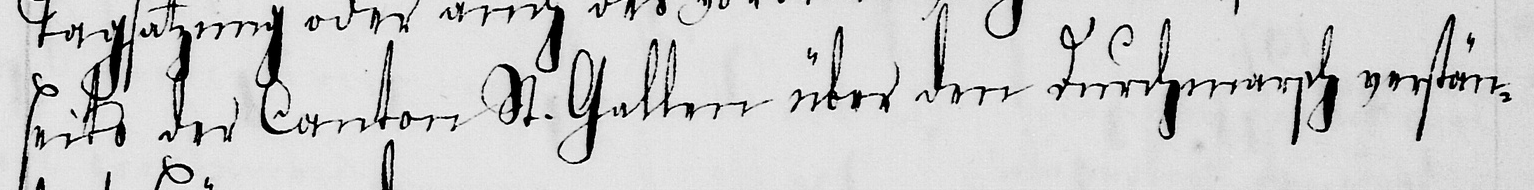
seits der Canton St. Gallen über den Durchmarsch verstän¬
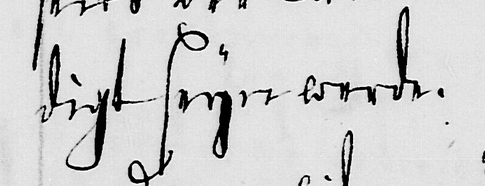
digt seyn werde.
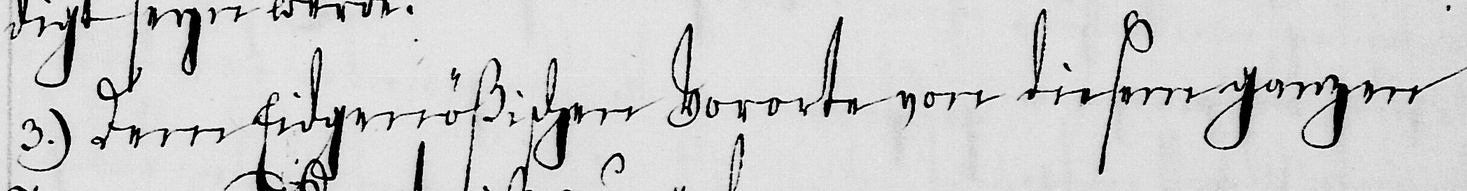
3.) Dem Eidgenößischen Vororte von diesem ganzen
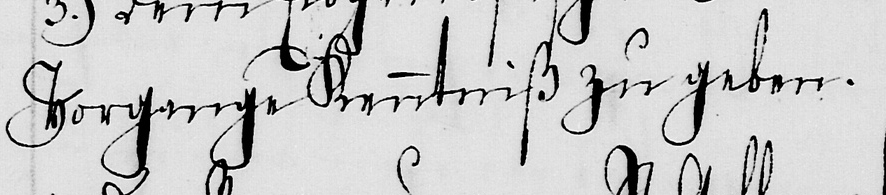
Vorgange Kenntniß zu geben.
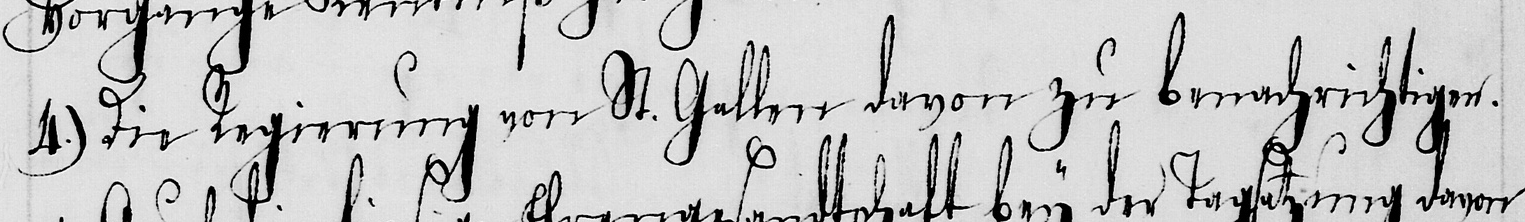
4.) Die Regierung von St. Gallen davon zu benachrichtigen.
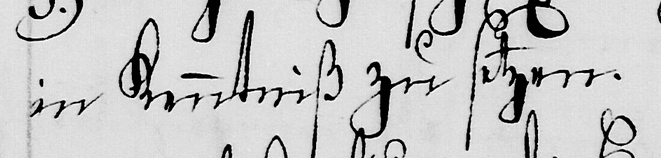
in Kenntniß zu setzen.
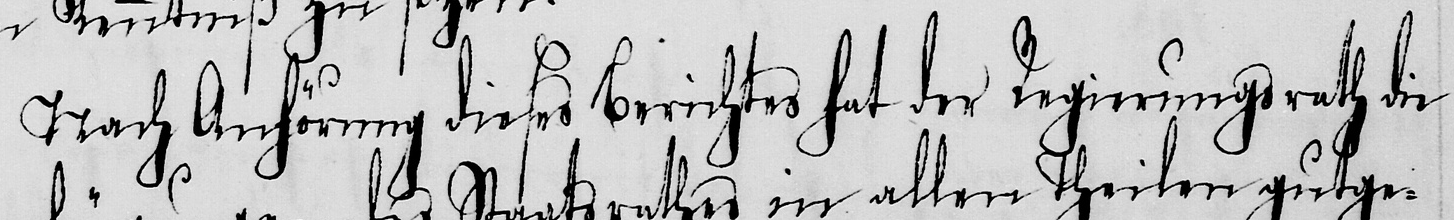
Nach Anhörung dieses Berichtes hat der Regierungsrath die
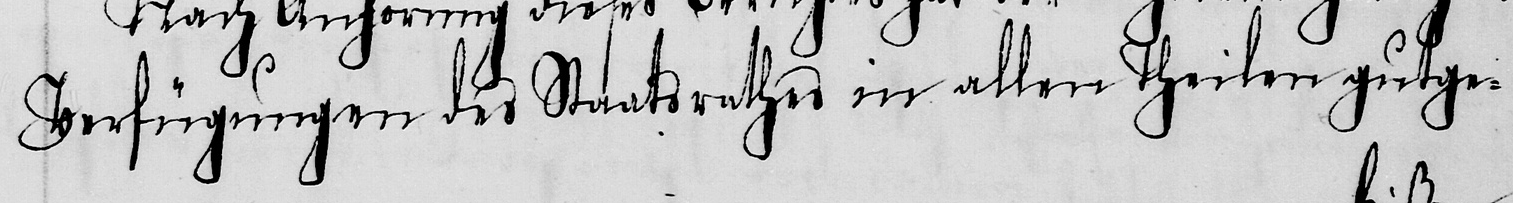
Verfügungen des Staatsrathes in allen Theilen gutge-
